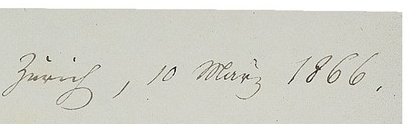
Zürich, 10 März 1866.
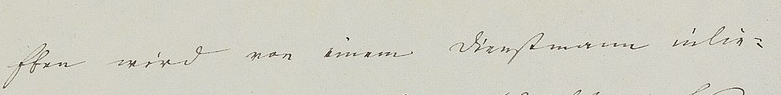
Eben wird von einem Dienstmann inlie-
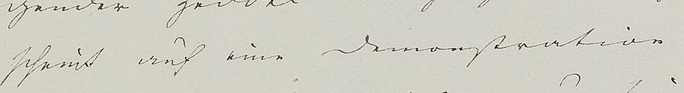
scheint auf eine Demonstration
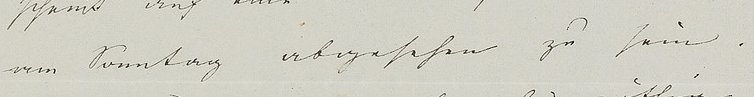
am Sonntag abgesehen zu sein.
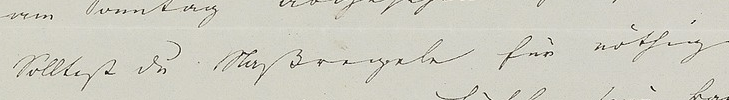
Solltest du Maßregeln für nöthig
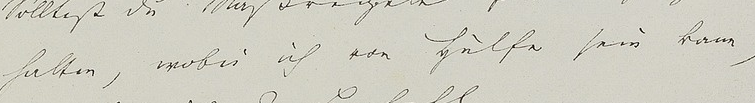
halten, wobei ich von Hülfe sein kann,
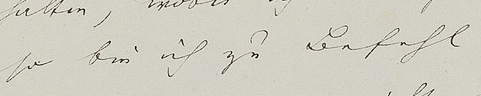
so bin ich zu Befehl.
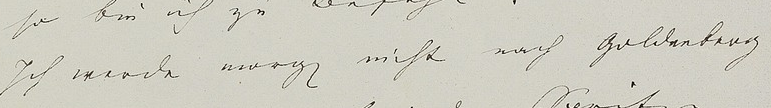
Ich werde morgen nicht nach Goldenberg
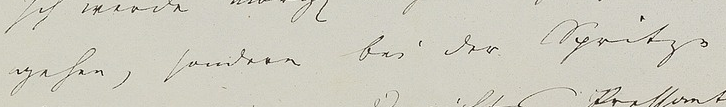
gehen, sondern bei der Spritze
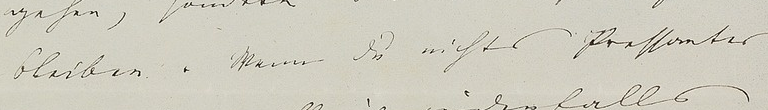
bleiben. Wenn du nichts Pressantes
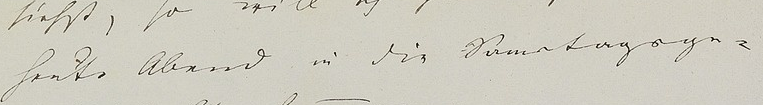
heute Abend in die Samstagsge-
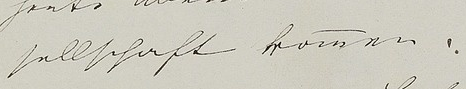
sellschaft kommen.
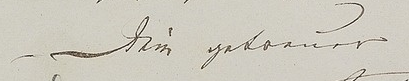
dein getreuer
